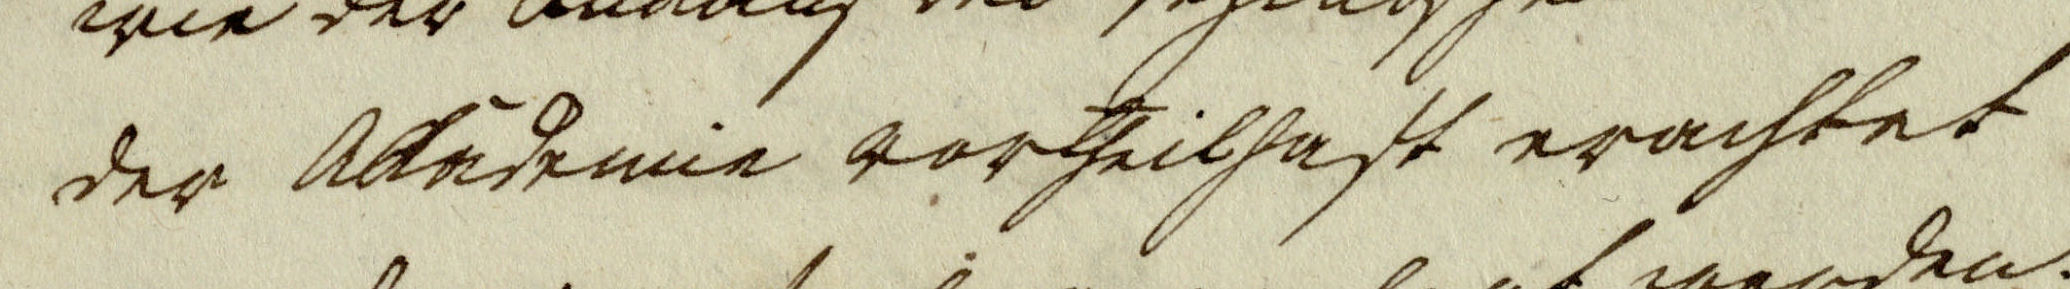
der Akademie vortheilhaft erachtet
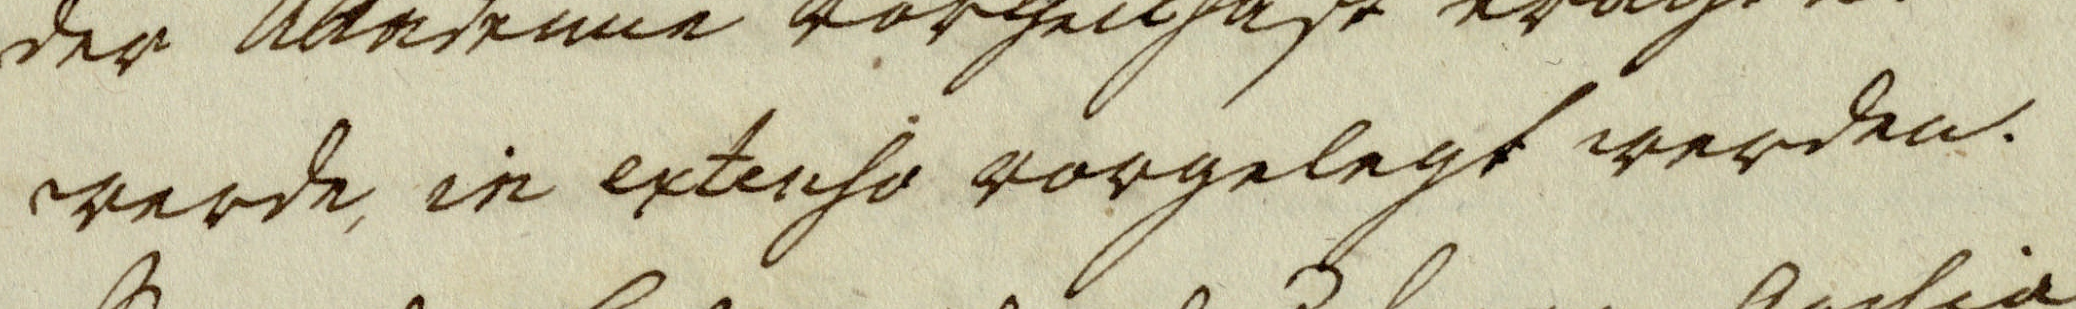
werde in extenso vorgelegt werden.
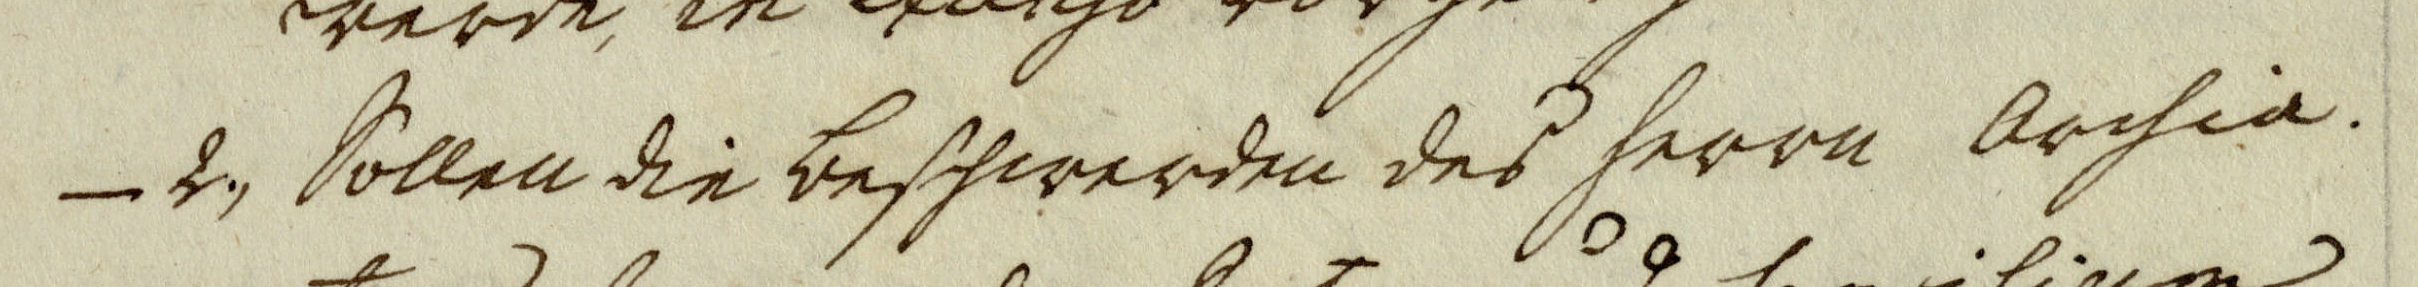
2., Sollen die Beschwerden des Herrn Archia¬
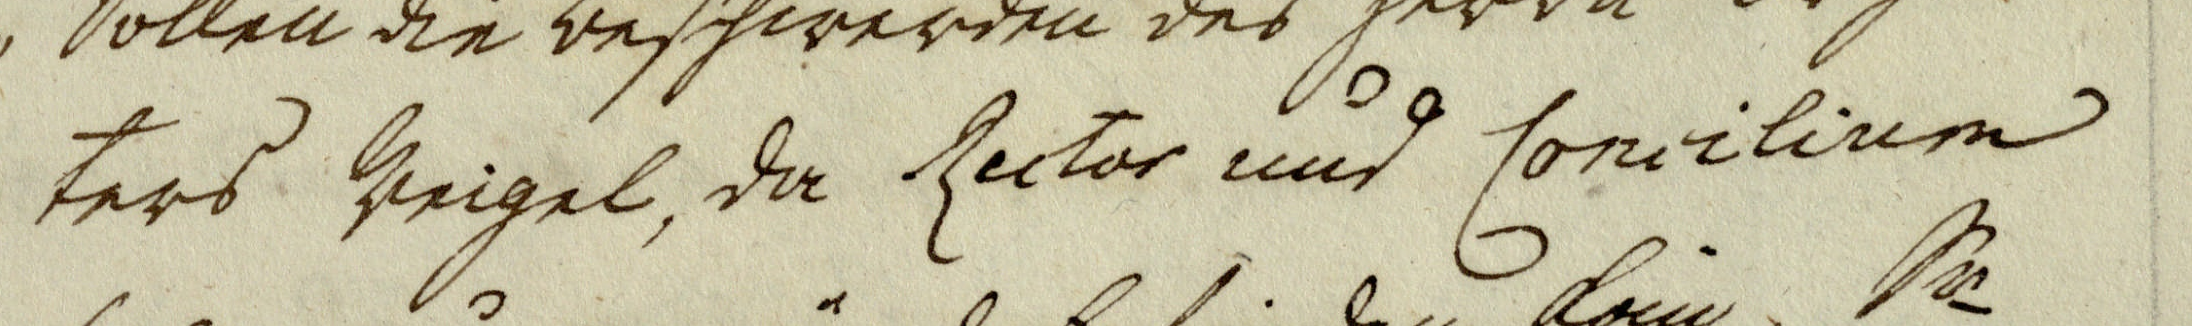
ters Weigel, da Rector und Concilium
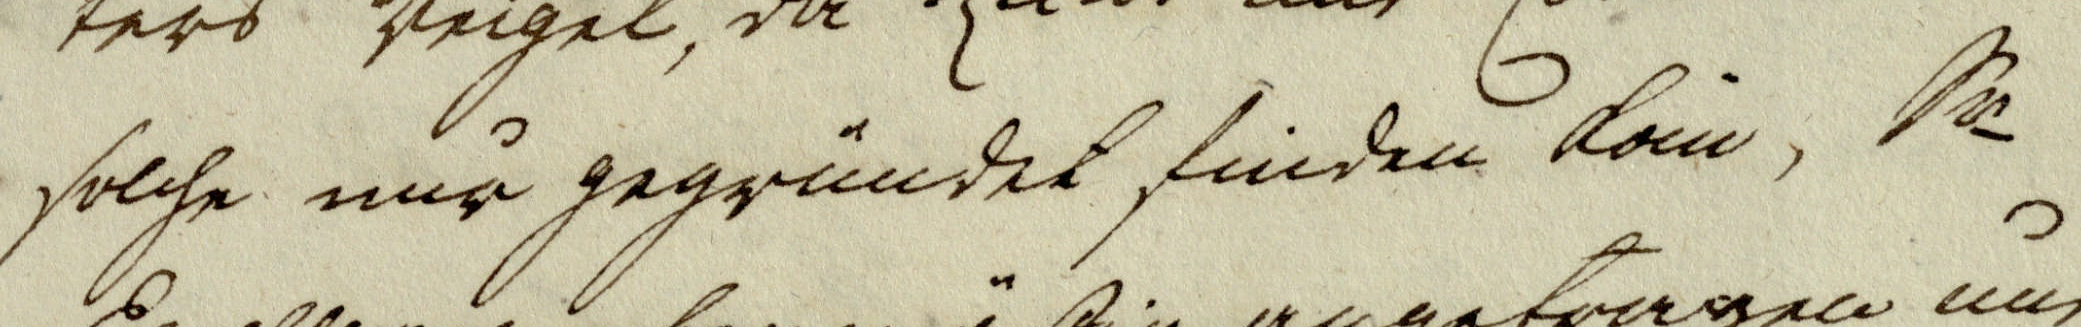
solche nur gegründet finden kan, Sr
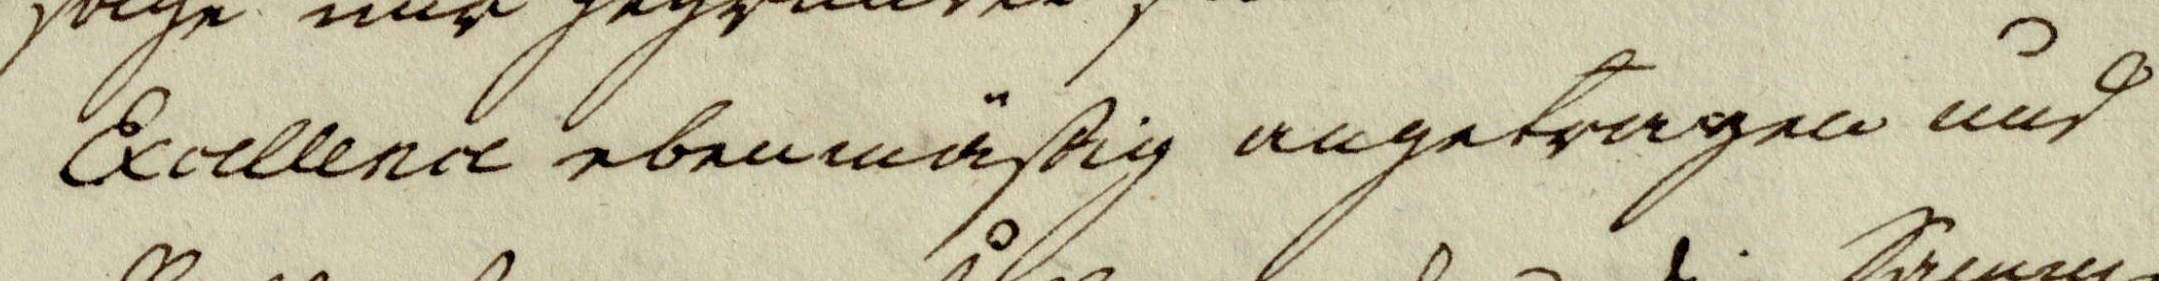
Excellence ebenmäßig angetragen und
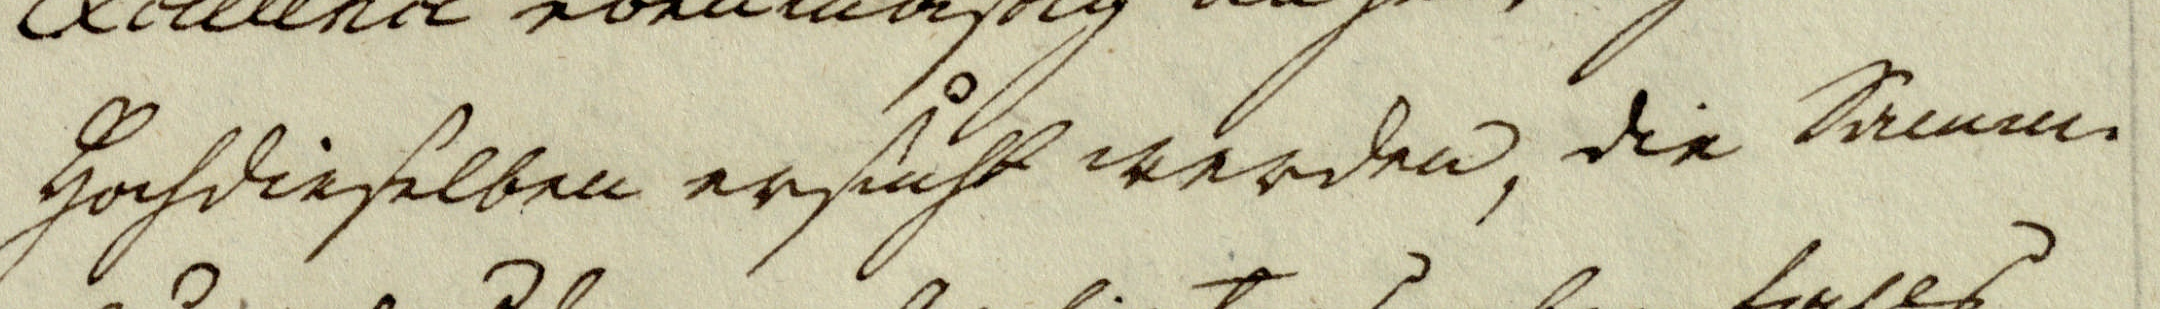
Hochdieselben ersucht werden, die Samm¬
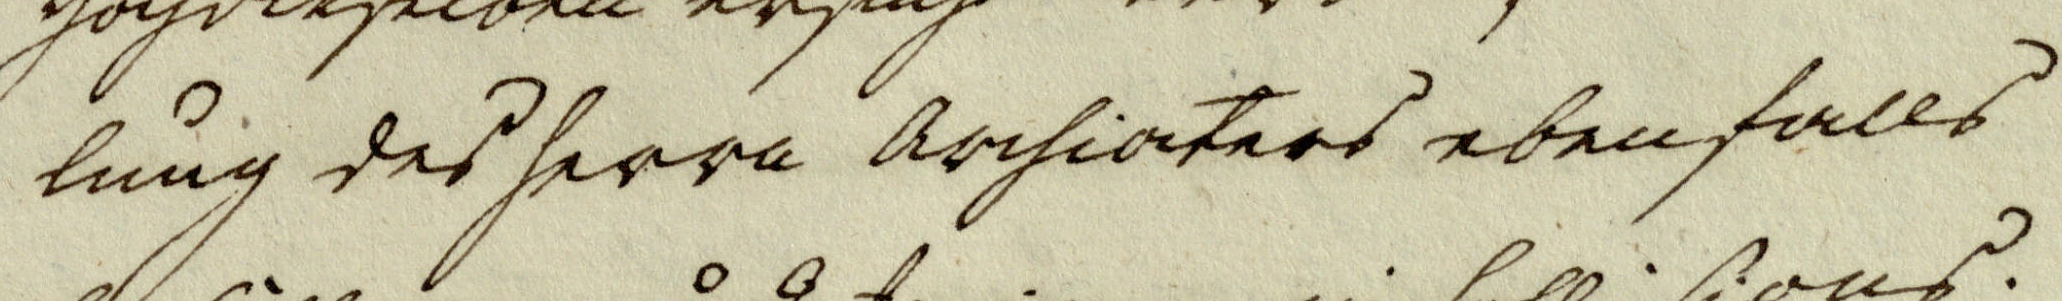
lung des Herrn Archiaters ebenfalls
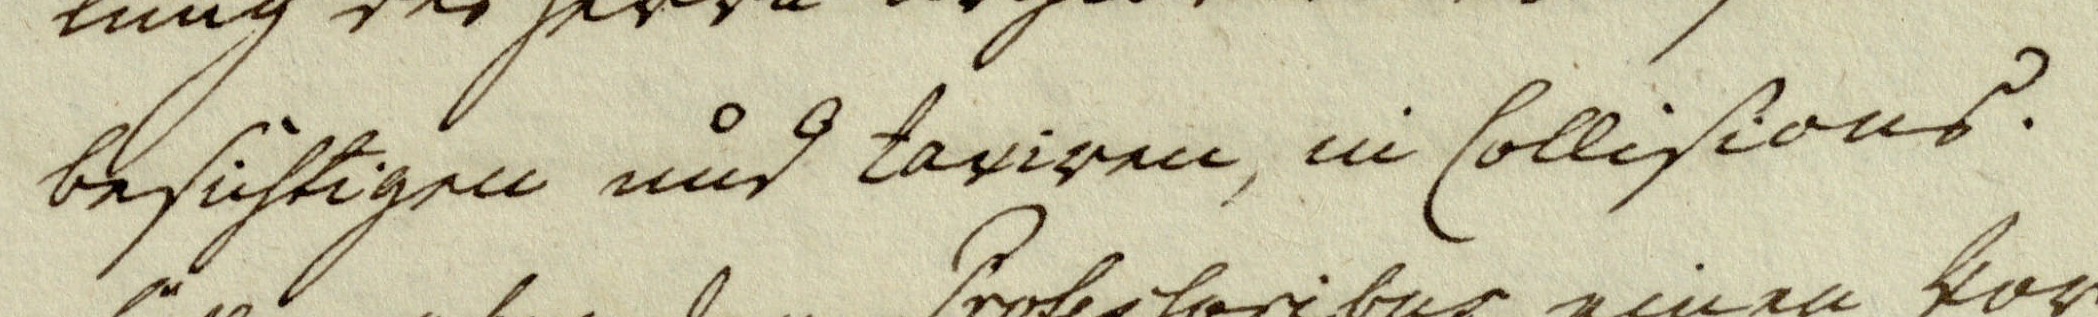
besichtigen und taxiren, in Collisions¬
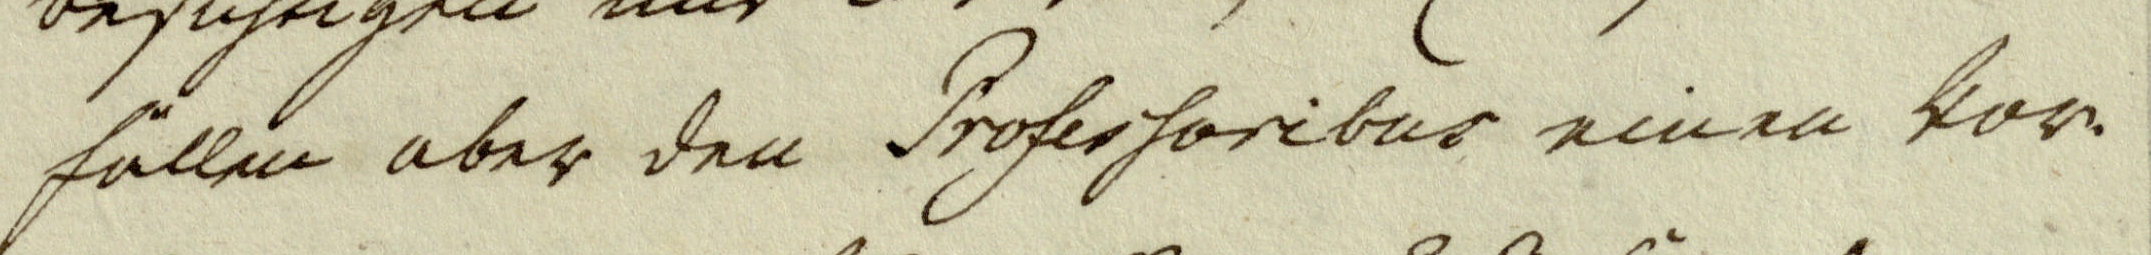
fällen aber den Professoribus einen Vor¬
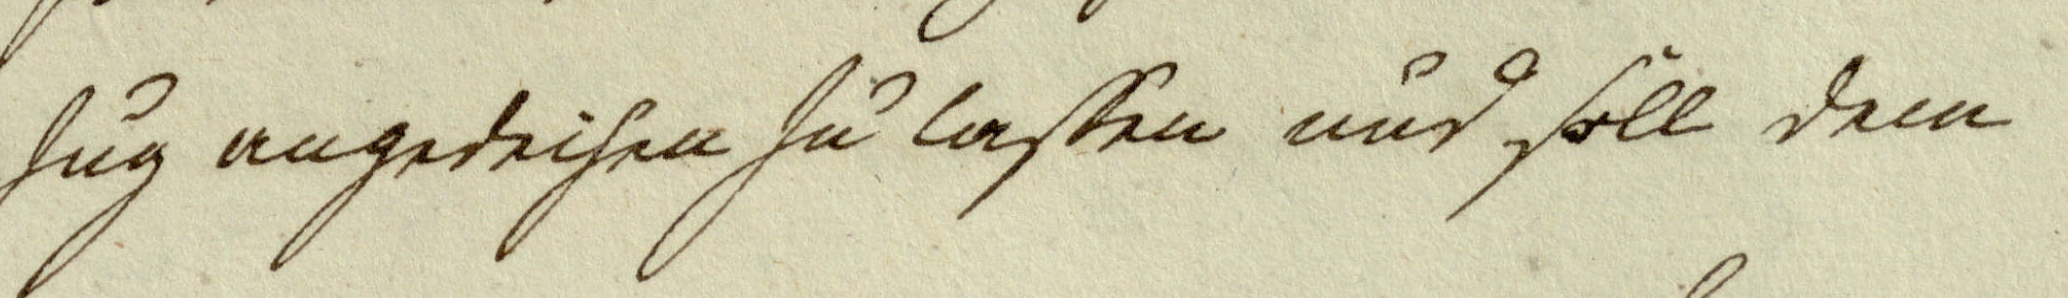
zug angedeihen zu lassen und soll dem
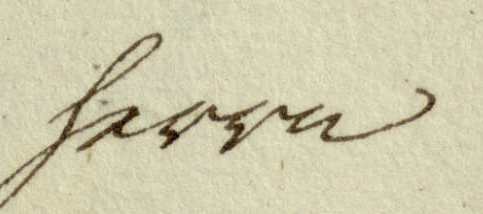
Herrn
